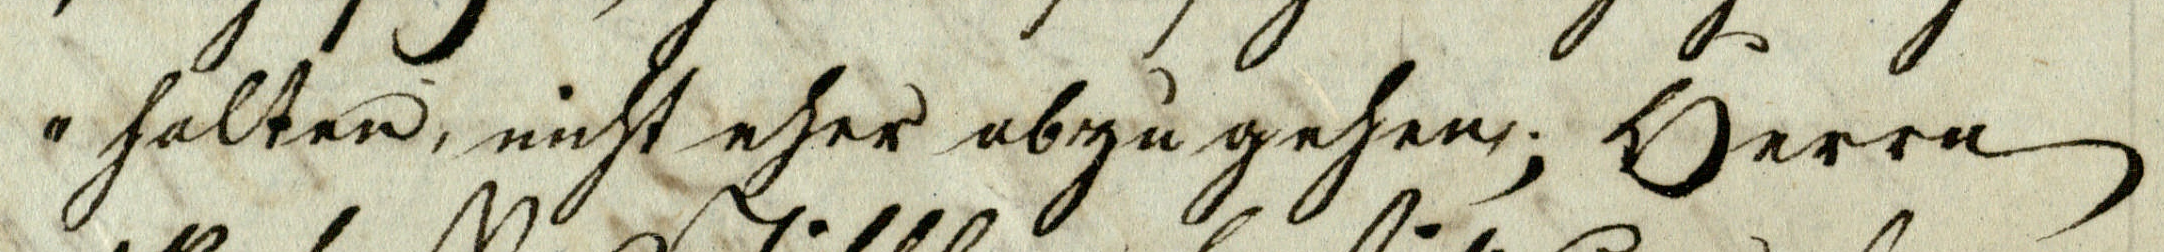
"halten, nicht eher abzugehen; Herrn
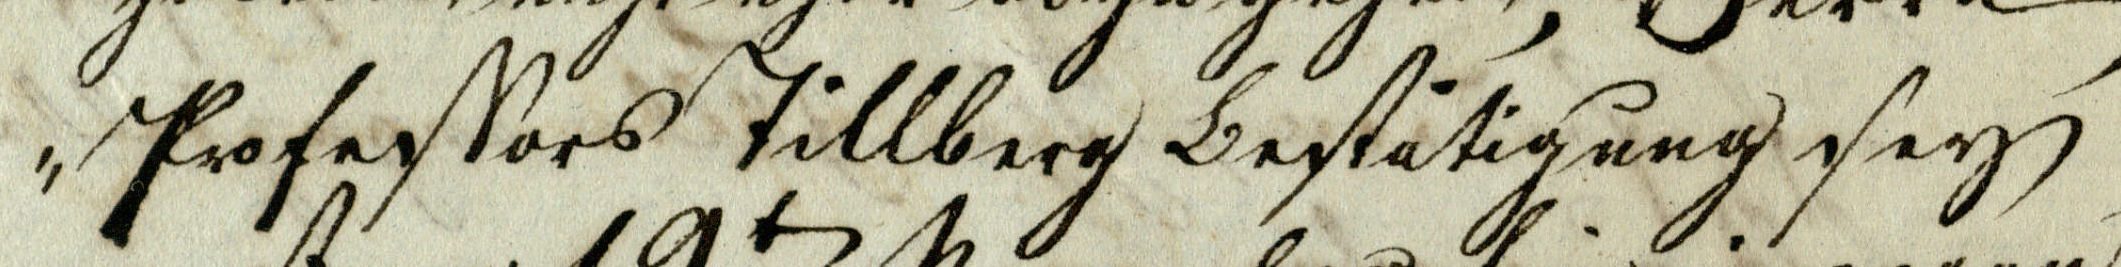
"Professors Tillberg Bestätigung sey
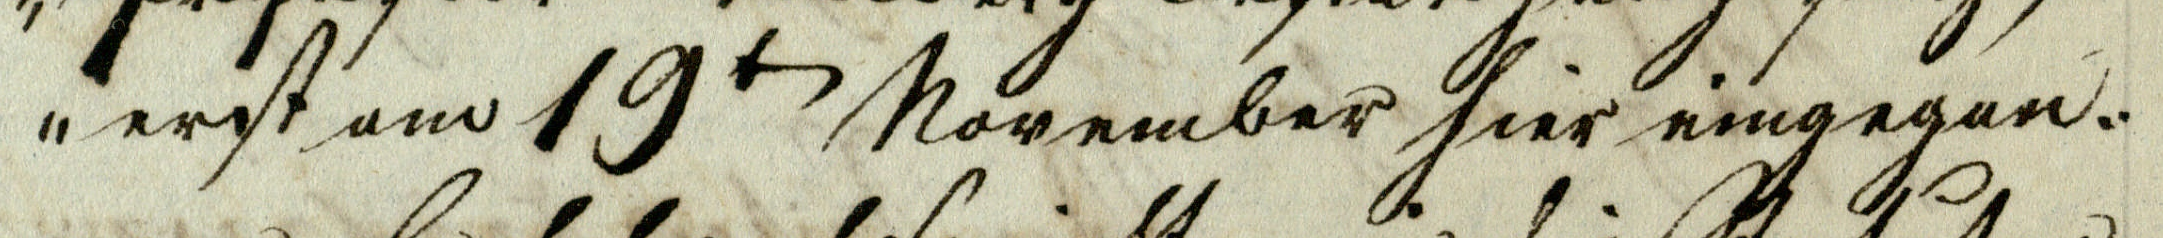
"erst am 19 ten November hier eingegan¬
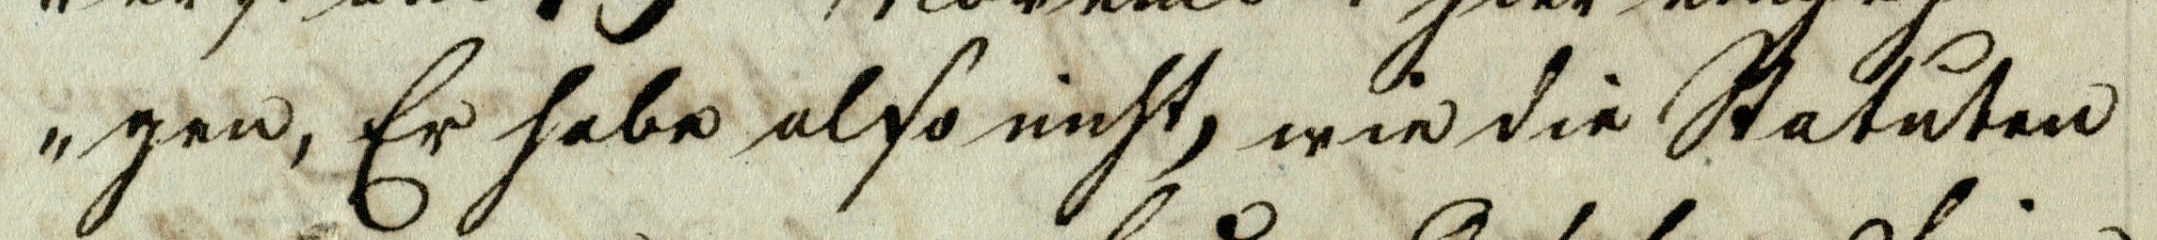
"gen, Er habe also nicht, wie die Statuten
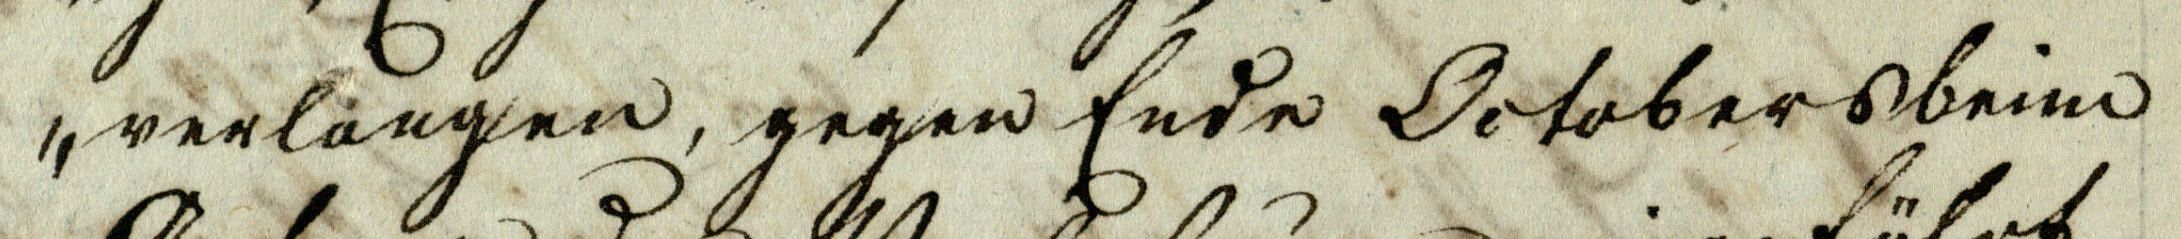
"verlangen, gegen Ende Octobers beim
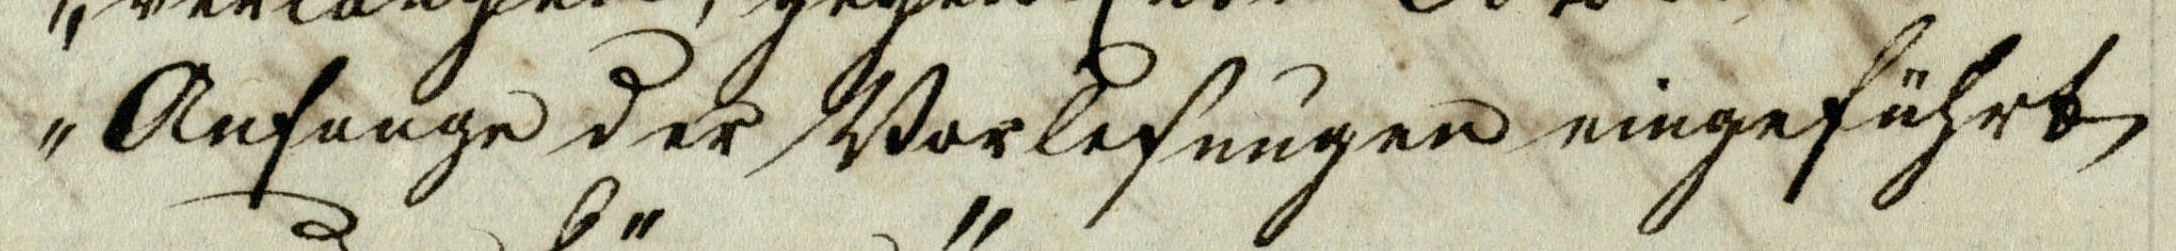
"Anfange der Vorlesungen eingeführt
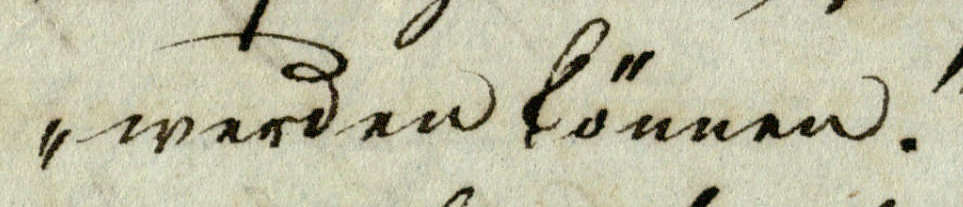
"werden können."
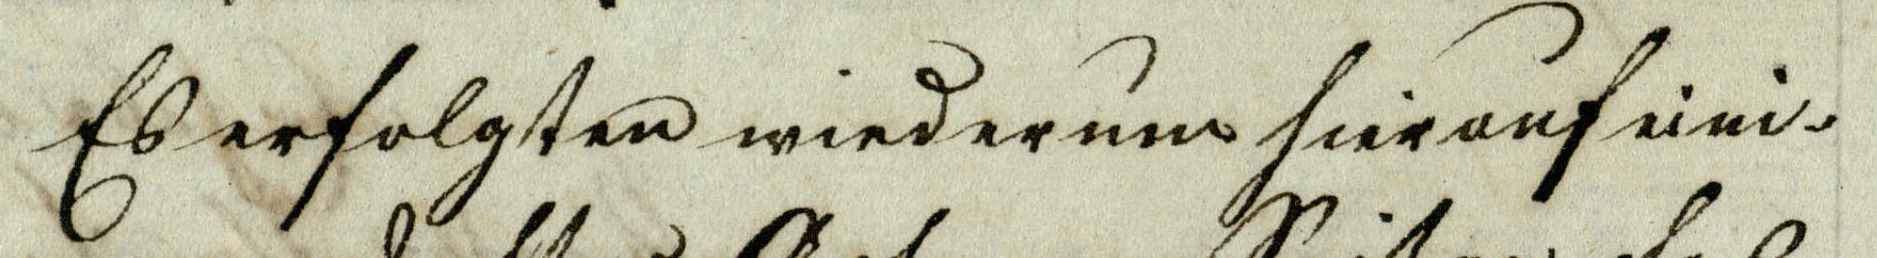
Es erfolgten wiederum hierauf eini¬
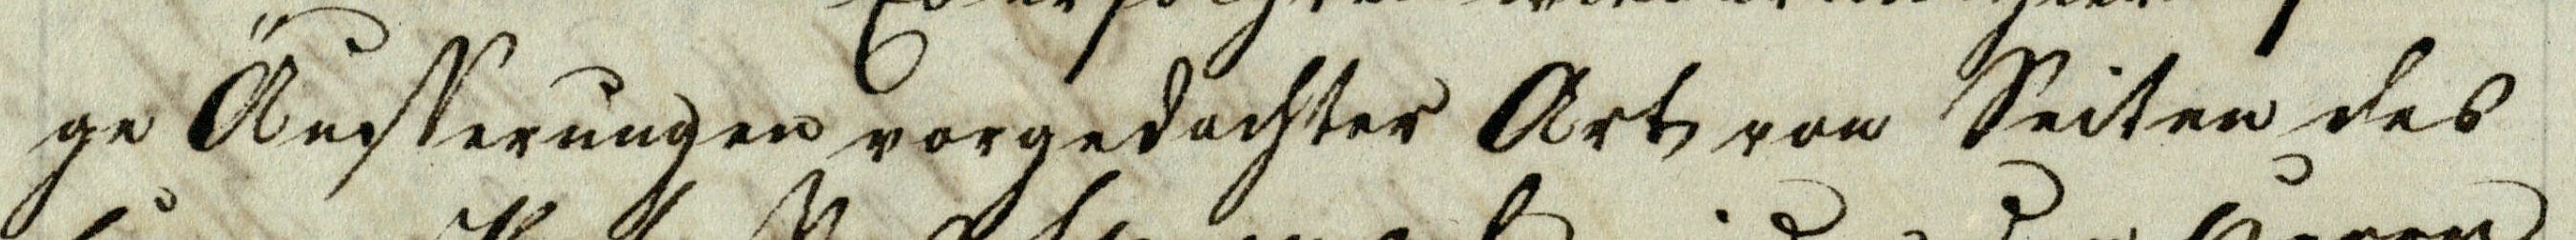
ge Äusserungen vorgedachter Art von Seiten des
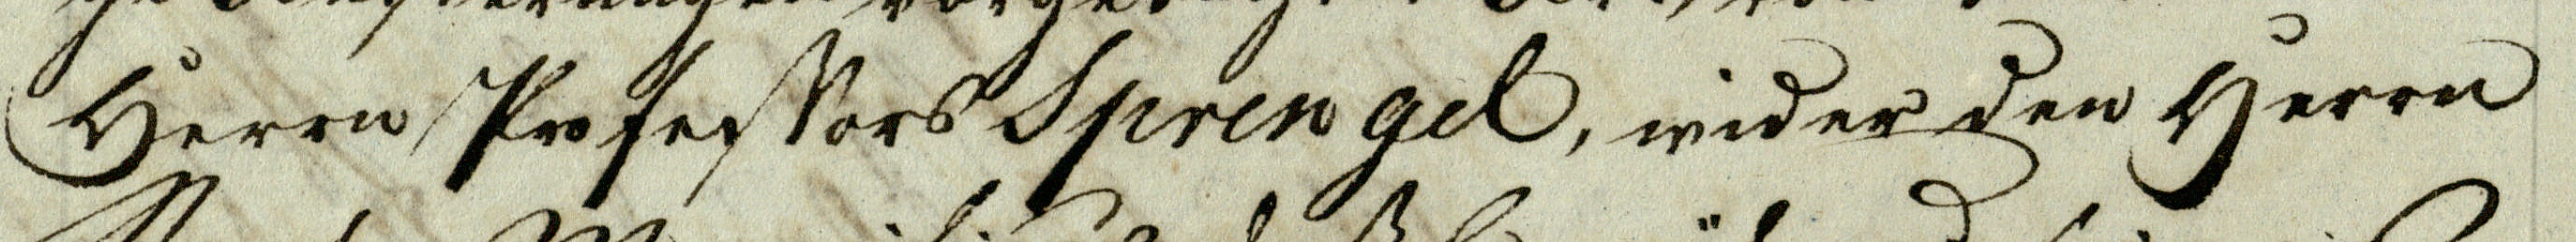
Herrn Professors Sprengel, wieder den Herrn
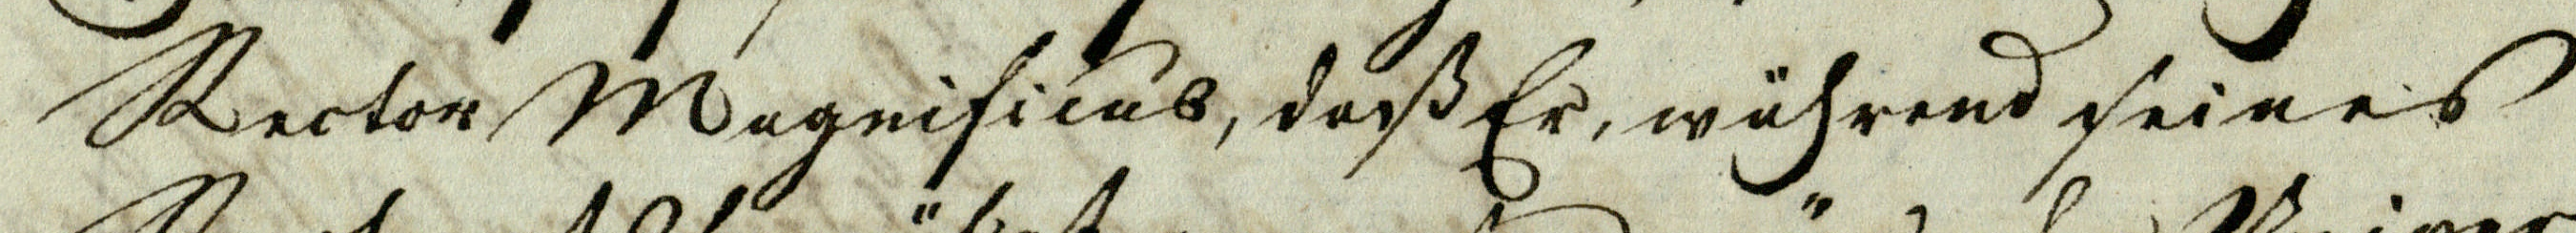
Rector Magnificus, daß Er, während seines
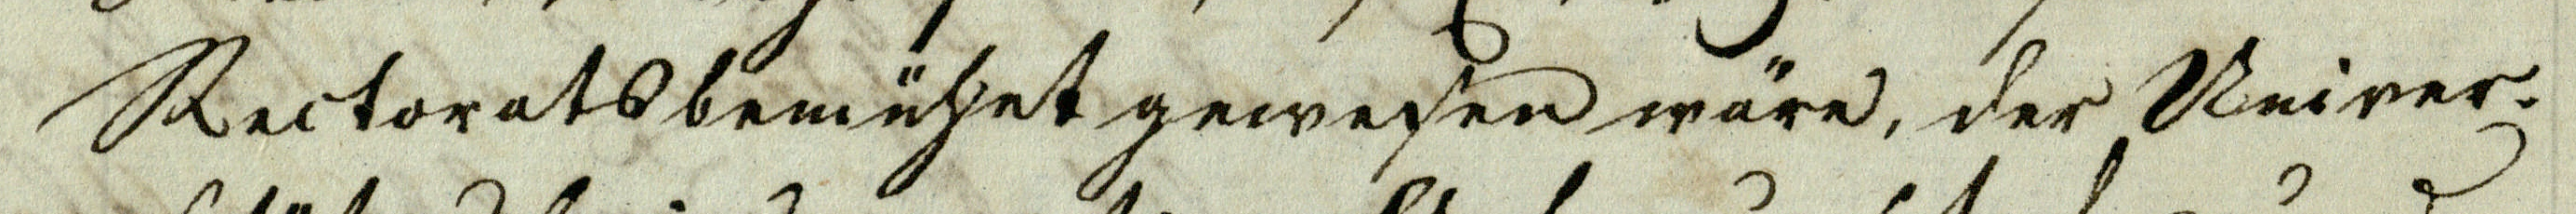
Rectorats bemühet gewesen wäre, der Univer¬
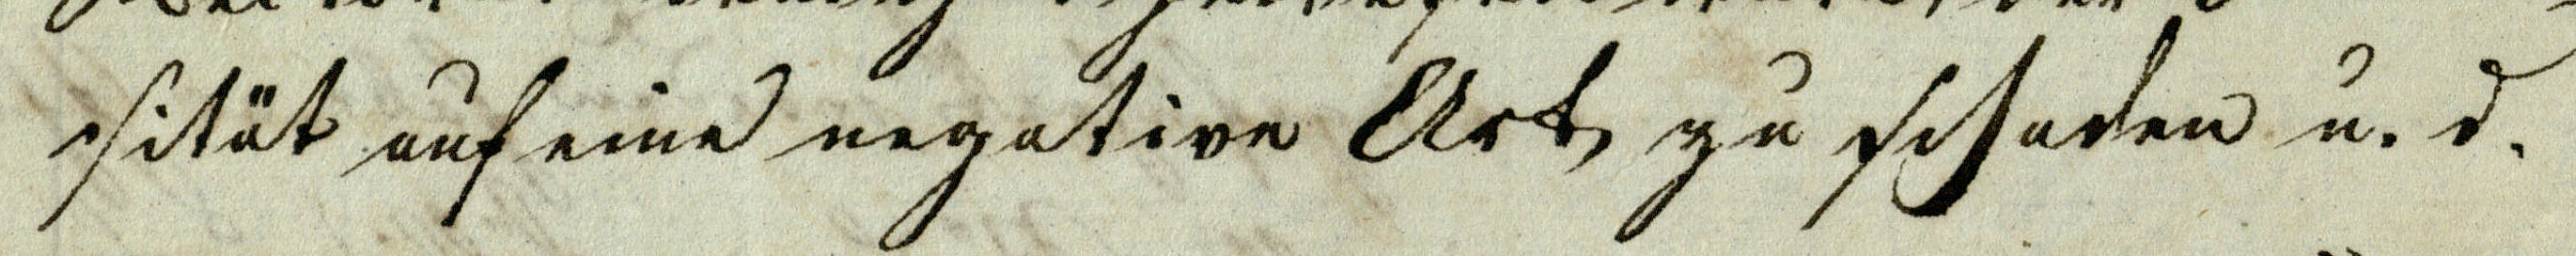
sität auf eine negative Art zu schaden u. d.
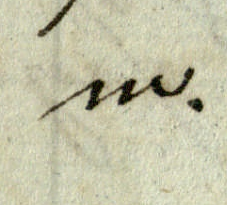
m.
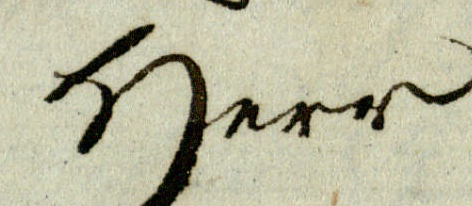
Herr
